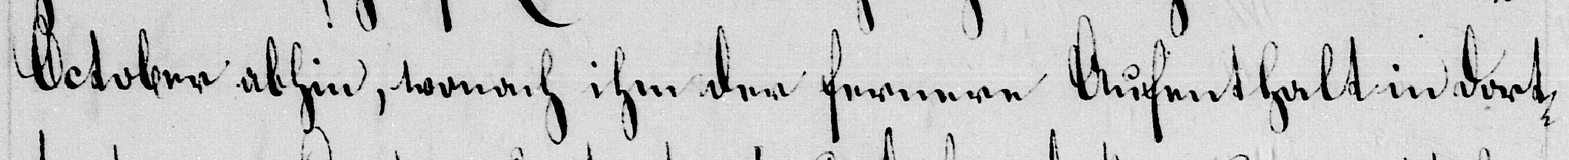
October abhin, wonach ihm der fernere Aufenthalt in dort¬
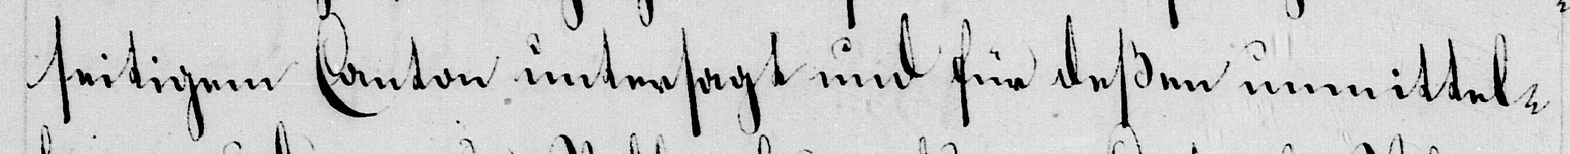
seitigem Canton untersagt und für deßen unmittel¬
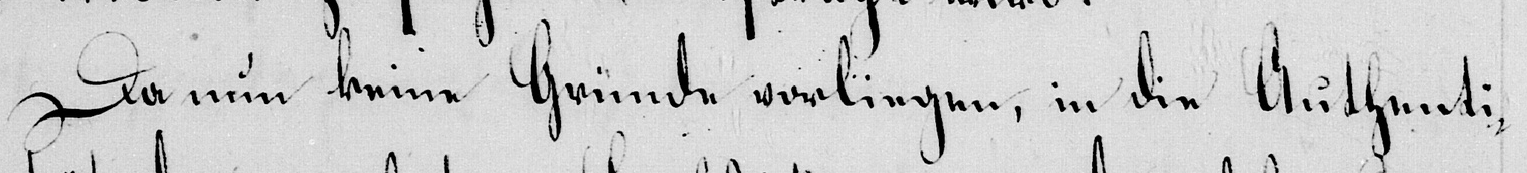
Da nun keine Gründe vorliegen, in die Authenti¬
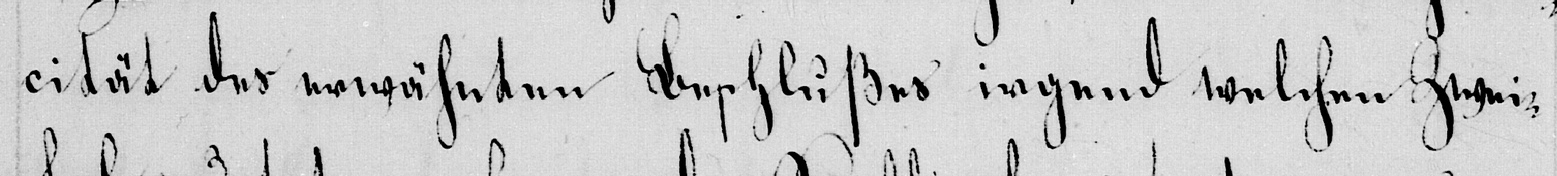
cität des erwähnten Beschlußes irgend welchen Zwei¬
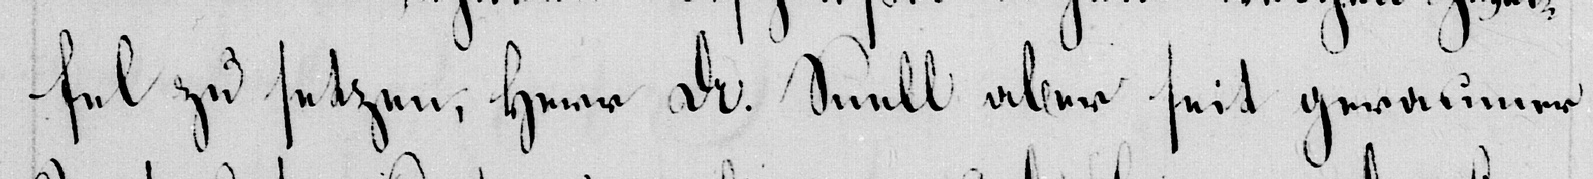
fel zu setzen, Herr Dr. Snell aber seit geraumer
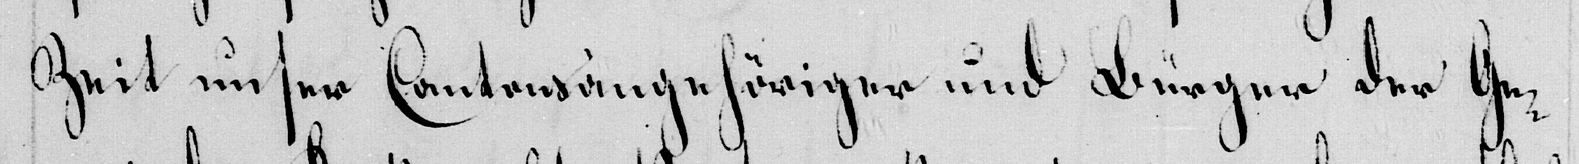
Zeit unser Cantonsangehöriger und Bürger der Ge¬
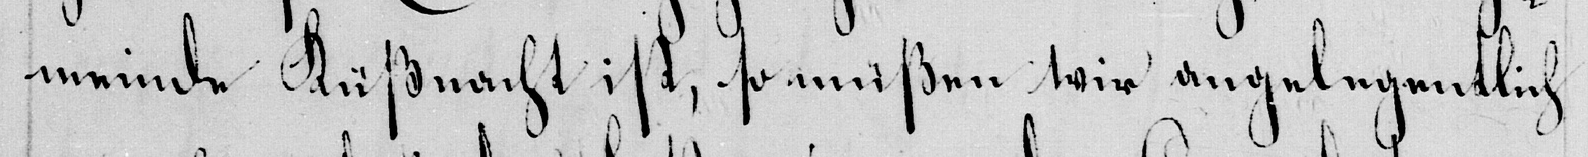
meinde Küßnacht ist, so müßen wir angelegentlich
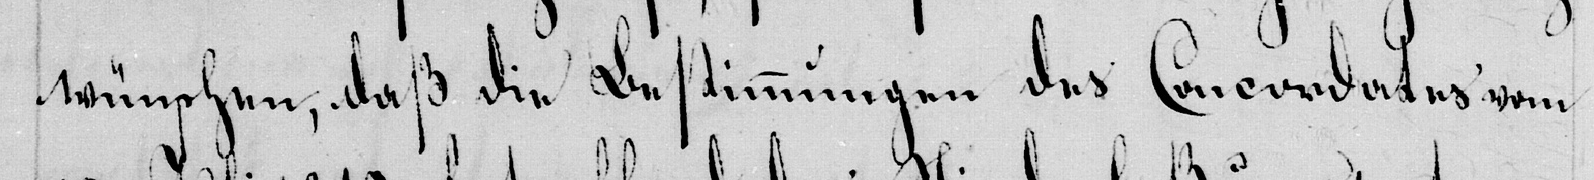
wünschen, daß die Bestimmungen des Concordates vom
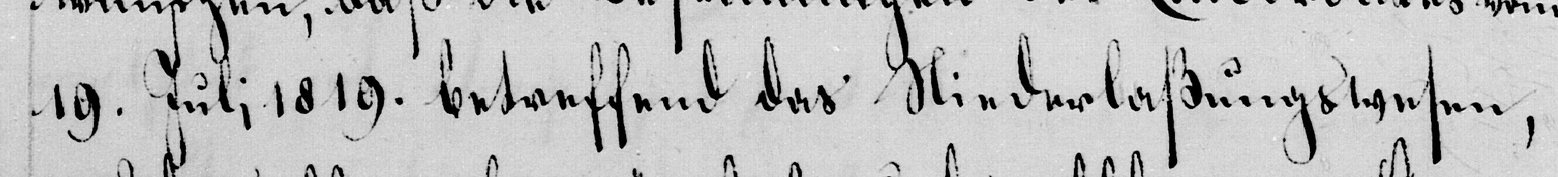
19. Juli 1819. betreffend das Niederlaßungswesen,
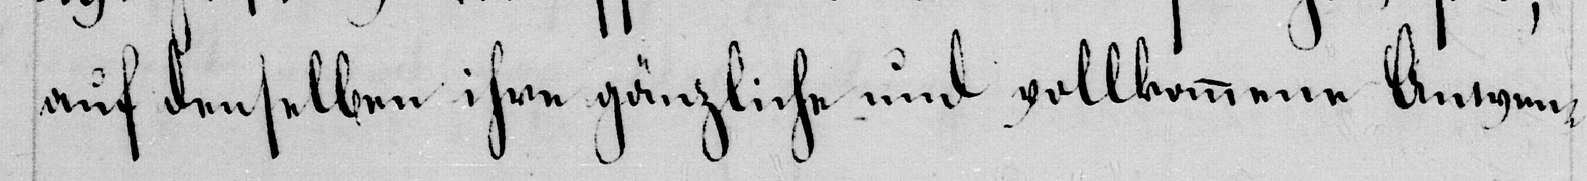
auf denselben ihre gänzliche und vollkommene Anwen-
